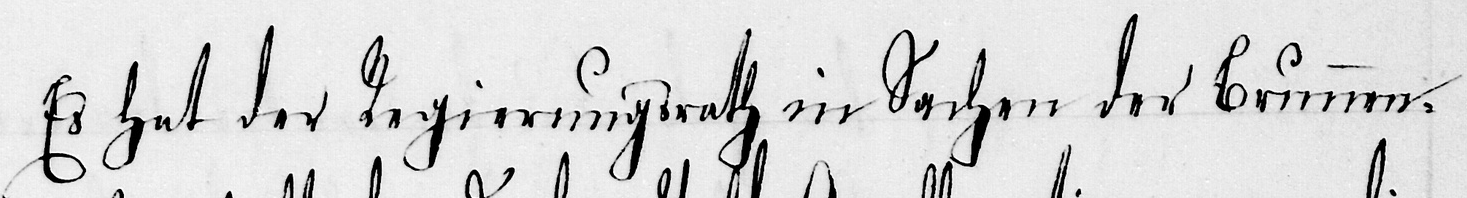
Es hat der Regierungsrath in Sachen der Brunnen¬
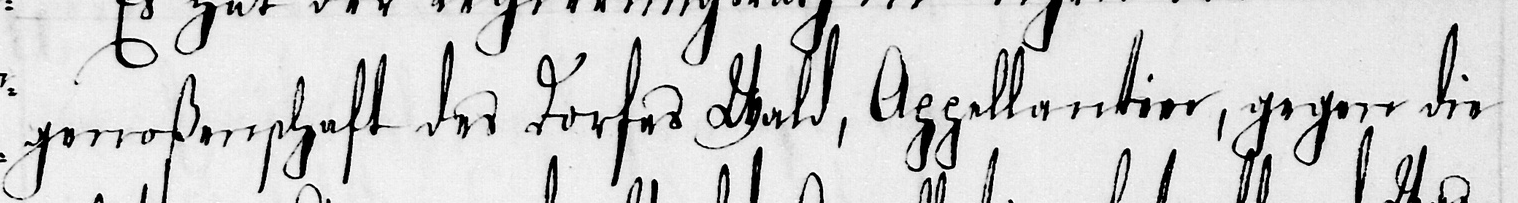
genoßenschaft des Dorfes Wald, Appellantin, gegen die
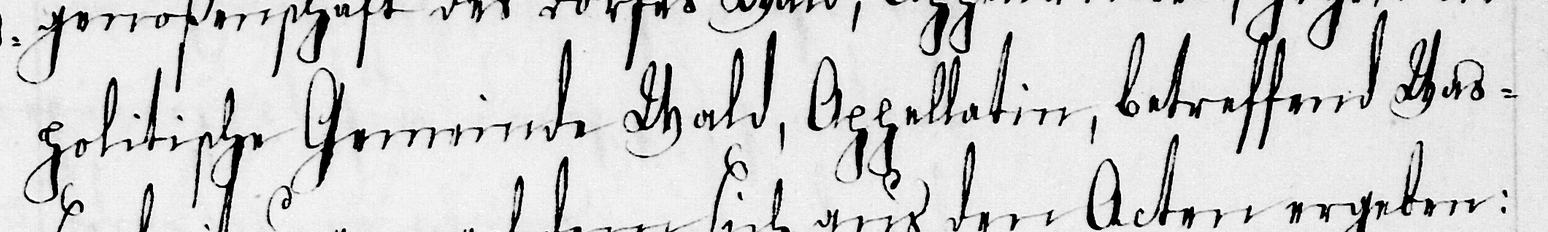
politische Gemeinde Wald, Appellatin, betreffend Waß¬
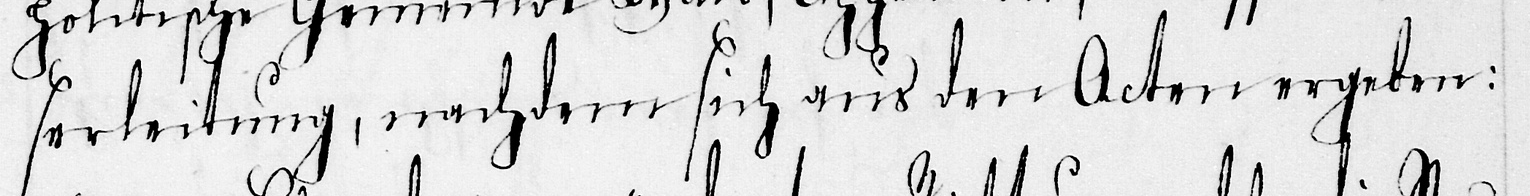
erleitung, nachdem sich aus den Acten ergeben:
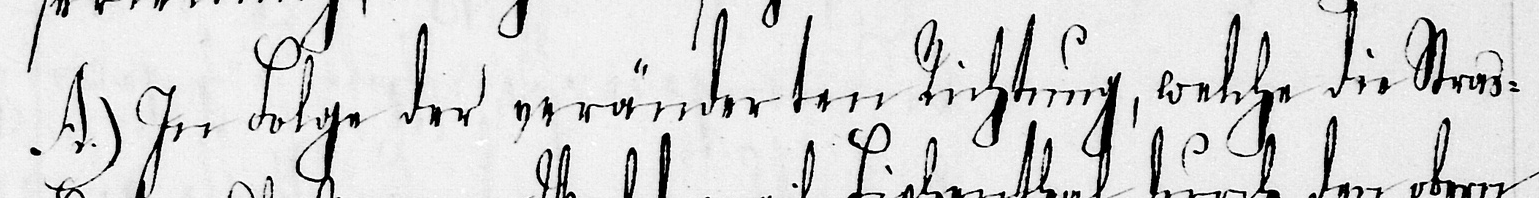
A.) In Folge der veränderten Richtung, welche die Stra¬
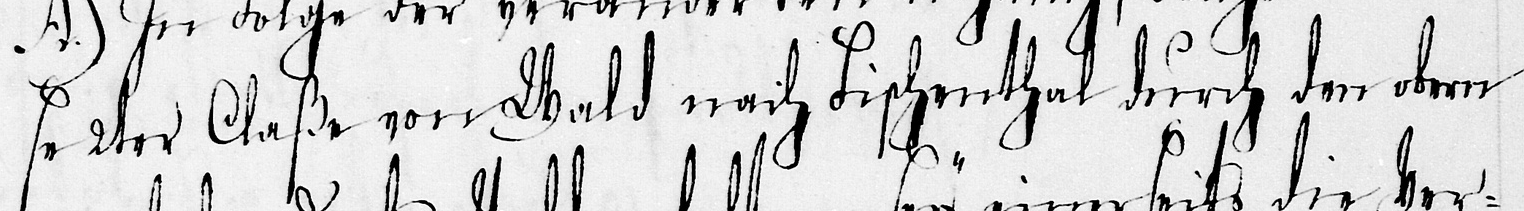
ße 2ter Claße von Wald nach Fischenthal durch den obern
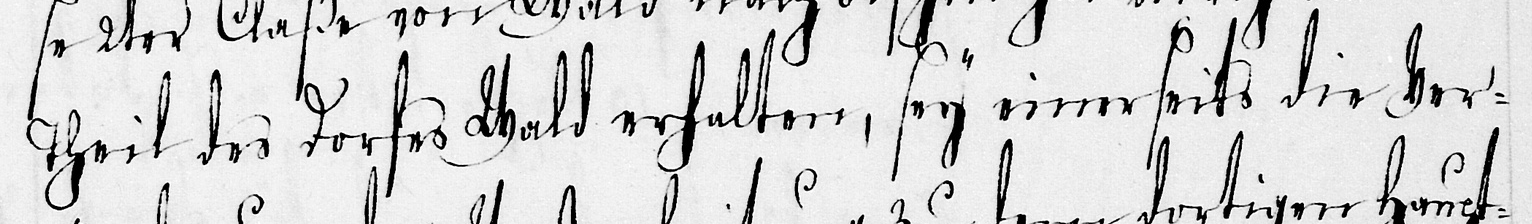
Theil des Dorfes Wald erhalten, sey einerseits die Ver¬
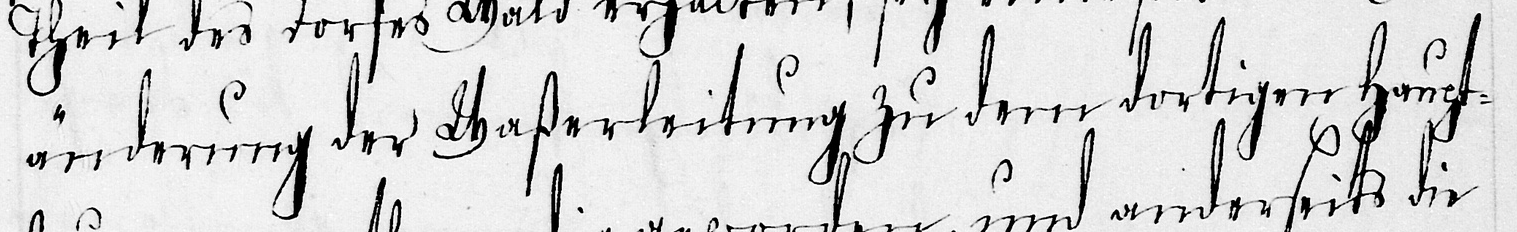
änderung der Waßerleitung zu dem dortigen Haupt¬
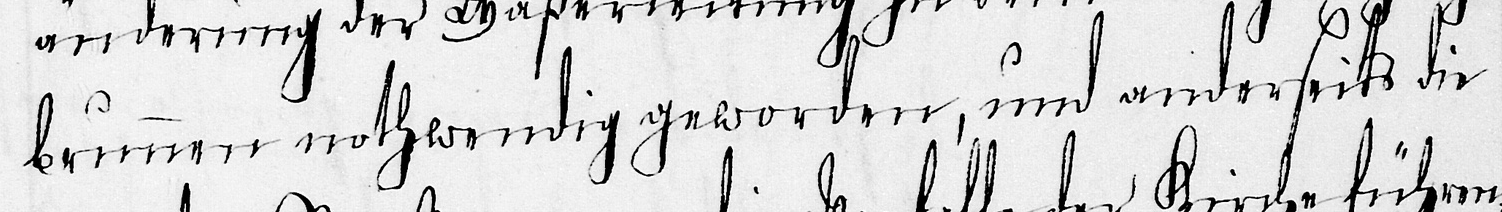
brunnen nothwendig geworden, und anderseits die
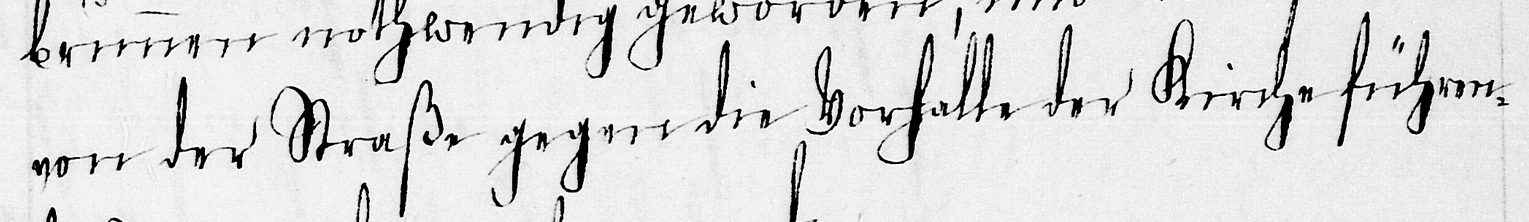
von der Straße gegen die Vorhalle der Kirche führen¬
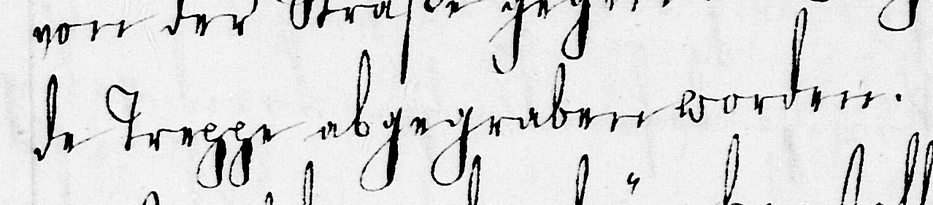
de Treppe abgegraben worden.
